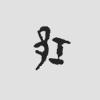{壬阝}
